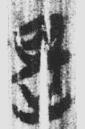是
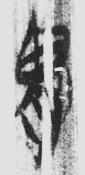胃（謂）
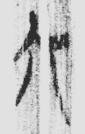六
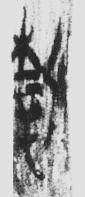{木辛斤}（親）
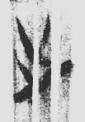之
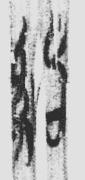約
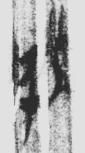成
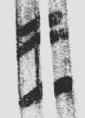王
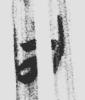曰
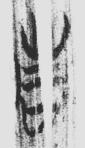青（請）
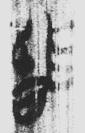䎽（問）
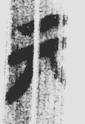亓
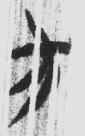方
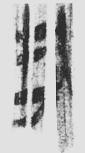周
